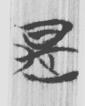是
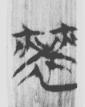{炎衣}
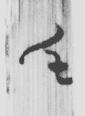氒
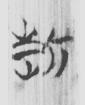折
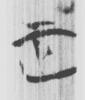正
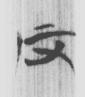反
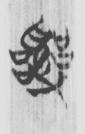𠧏（亂）
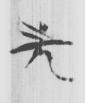先
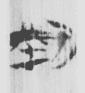型
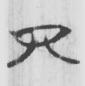四
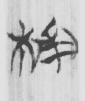{木甫}
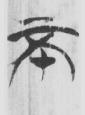不
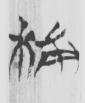{木甫}
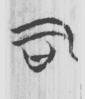司
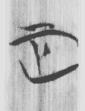正
